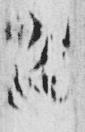湝
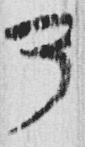乃
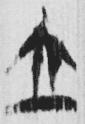立
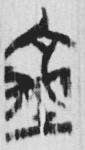○（禹）
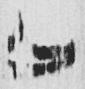㠯（以）
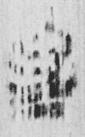爲
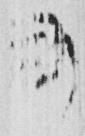司
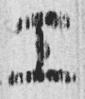工
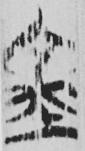○（禹）
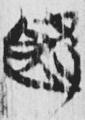既
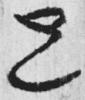已
